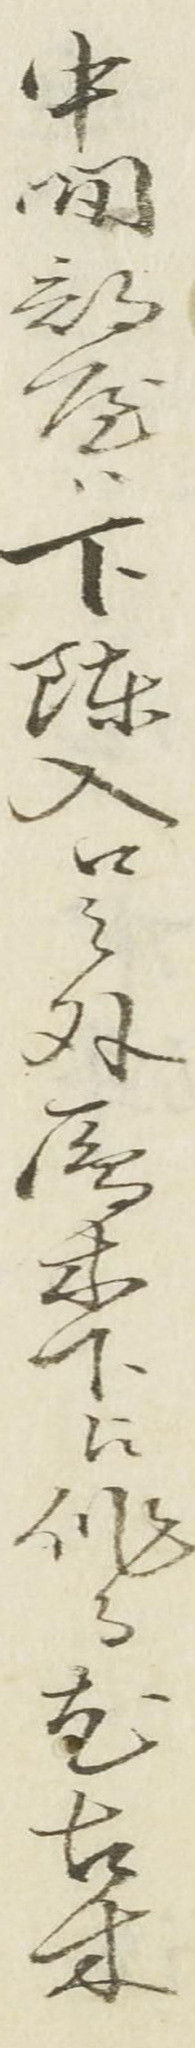中間部屋下陣入口之外鴈木下え作る尤古木
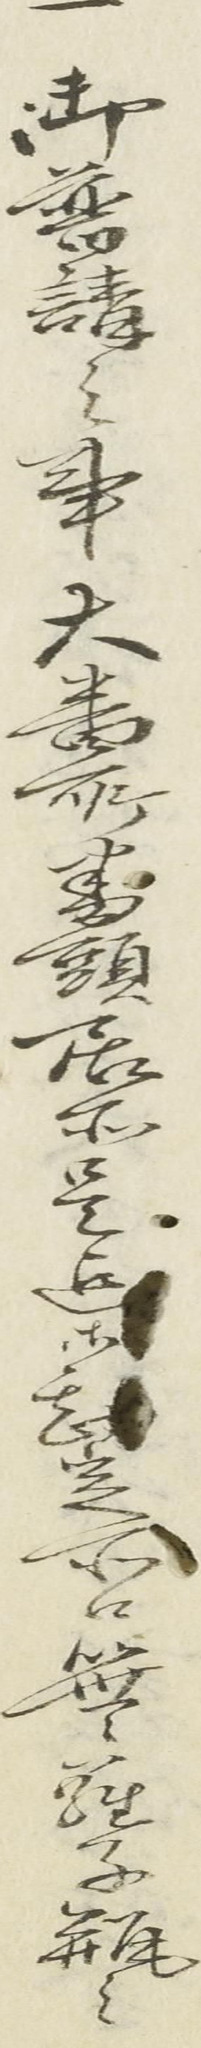一御普請之事大番所番頭居所是迄御勘定所口笹之羅子瓶之
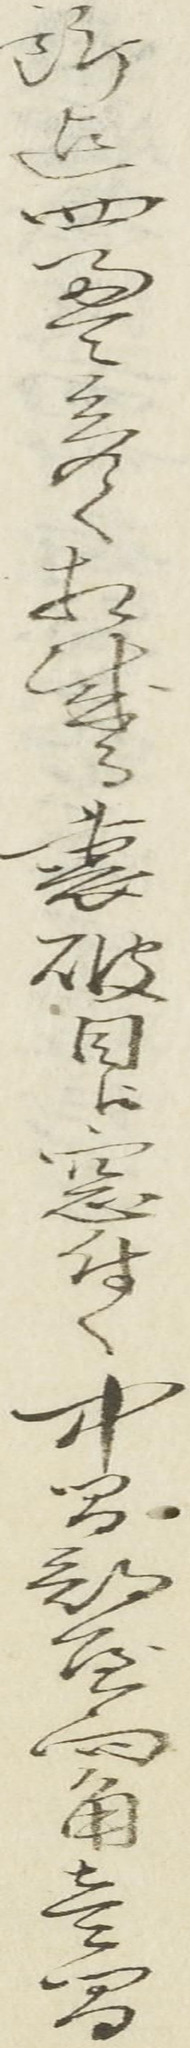所迄四畳多く相成る裏破目え窓付く中間部屋向角壱間
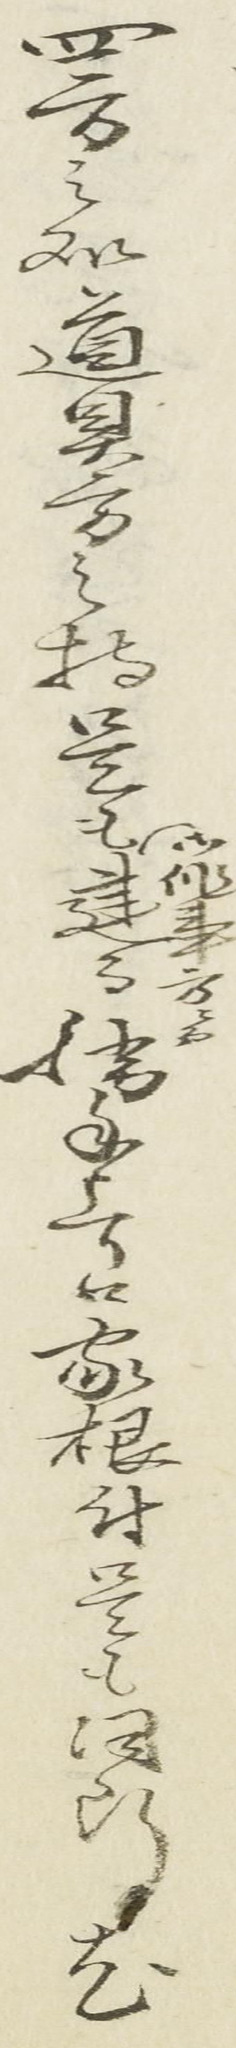四方の処道具方之持是も御作事方ニ而建る勝手上り口家根付是も同断尤
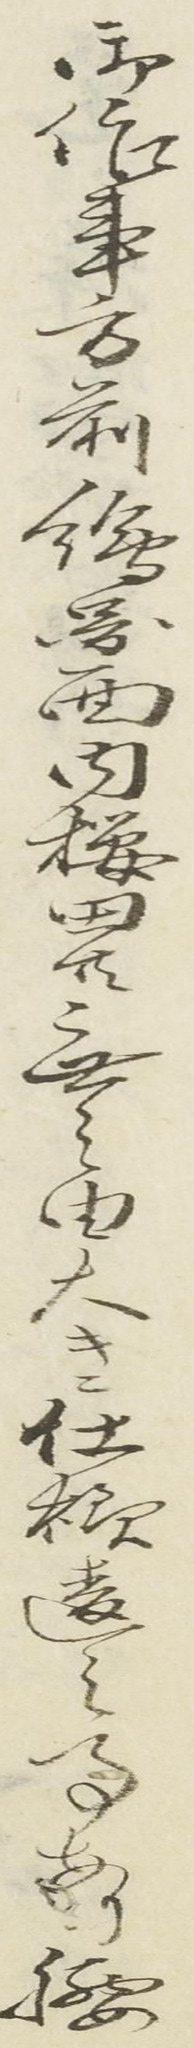御作事方前絵図西内桜田共無之由大キニ仕様違之事あり腰
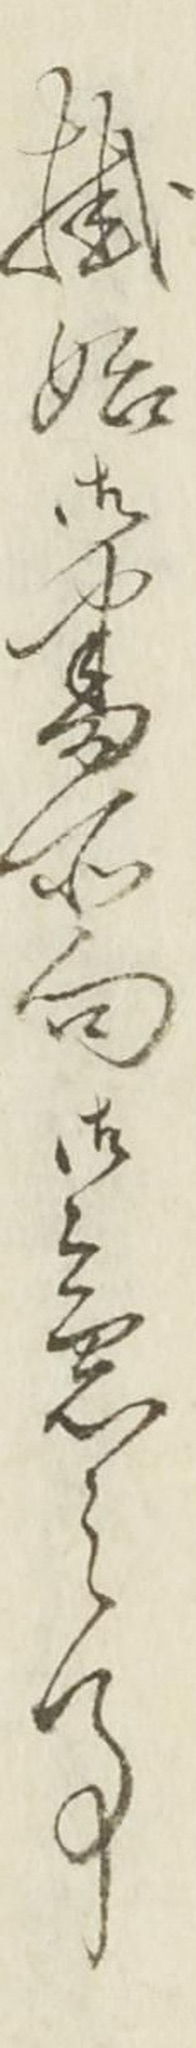掛始御番所向御急之事
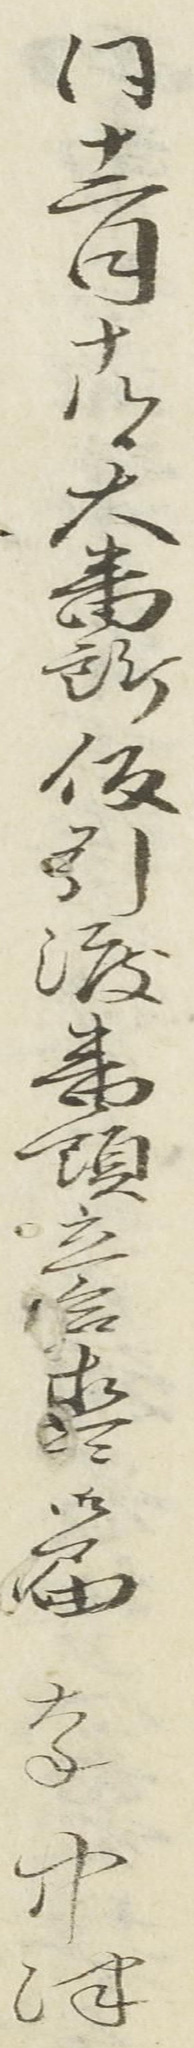同十二月十八日大番所仮引渡番頭立合直ニ御届大手中津
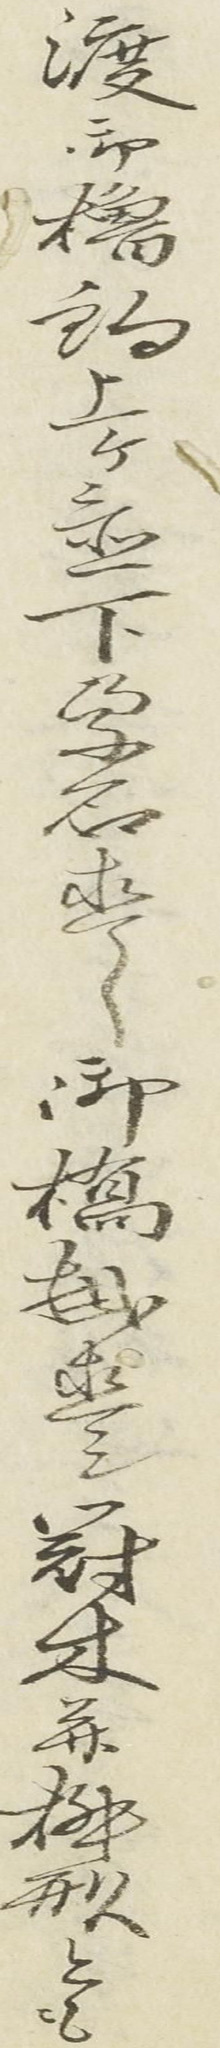渡御櫓釣上ケ置下孕石直し御橋掛直シ冠木幷枡形とも
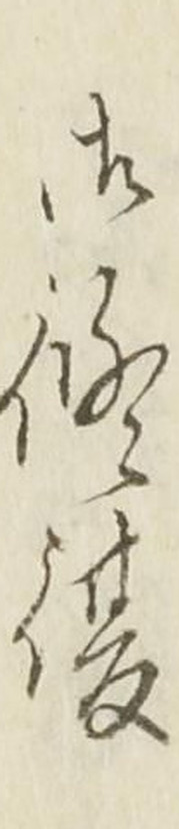御修復
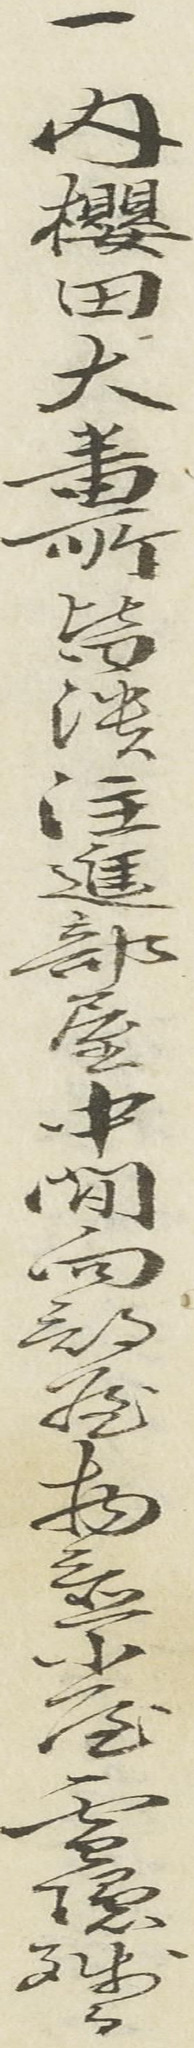一内桜田大番所皆潰注進部屋中間向部屋物置小屋雪隠残る
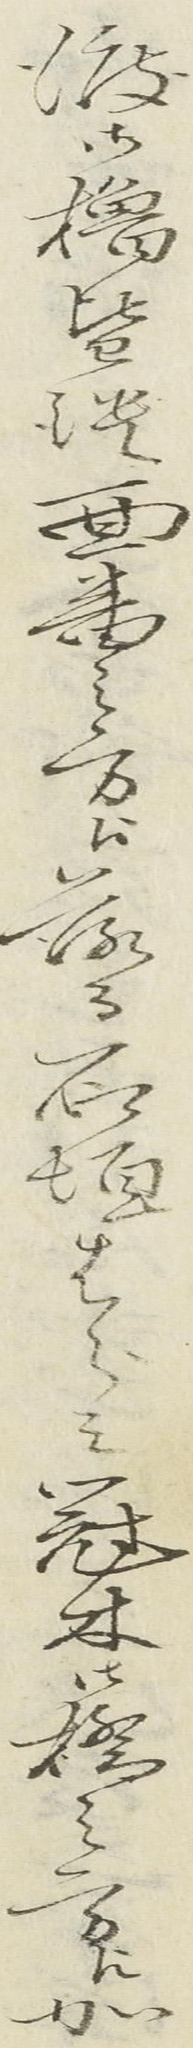渡御櫓皆潰西番之方え落る石垣はら三冠木御橋之方え加
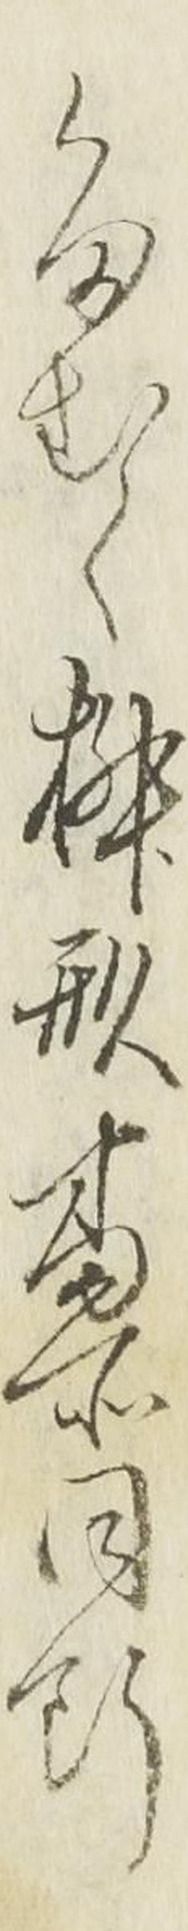たむく桝形番所同断
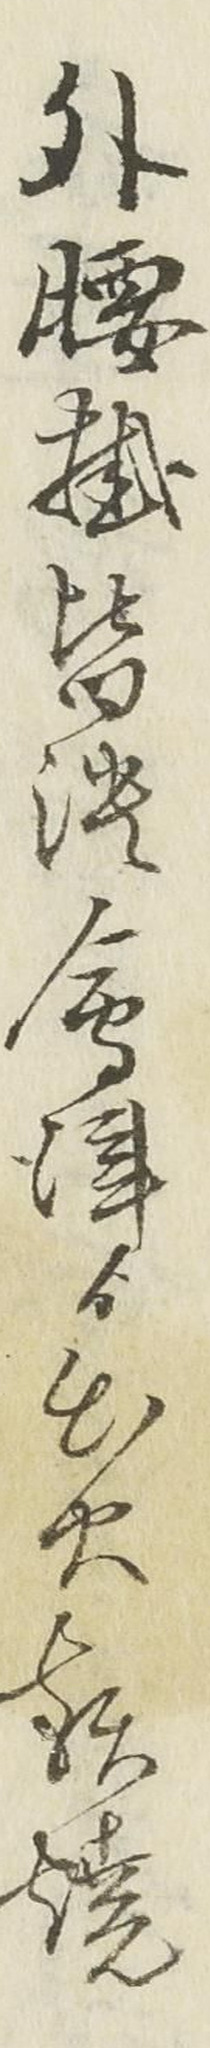外腰掛皆潰会津ゟ出火類焼
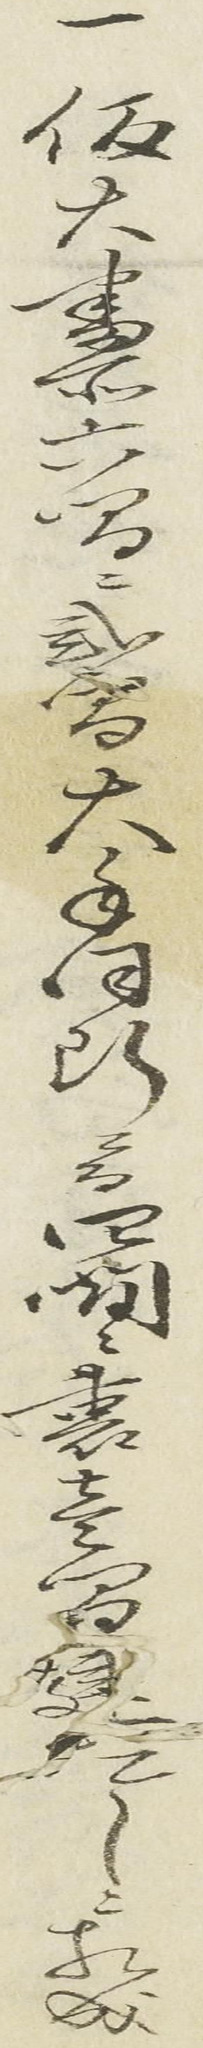一仮大番所六間ニ弐間大手同断ニ而四間ニ裏壱間建てシニ相成
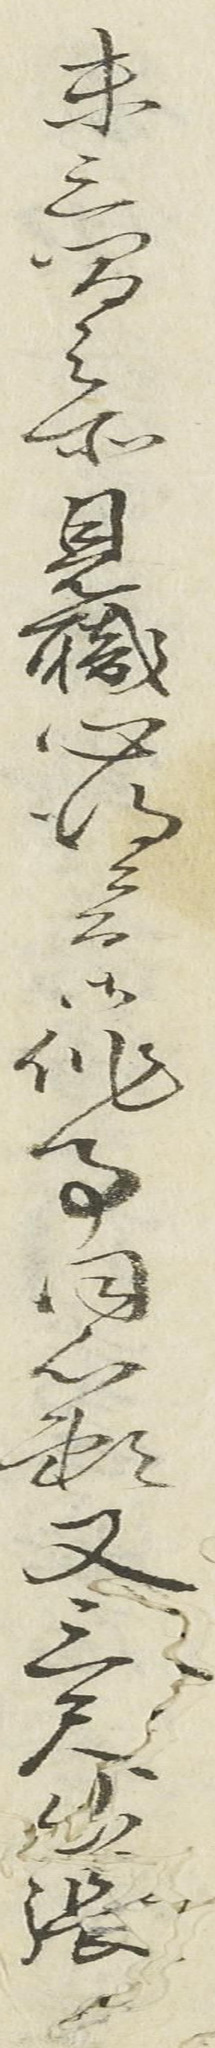未三間之所見職心得ニ而御作事同心頼又三尺虫損張
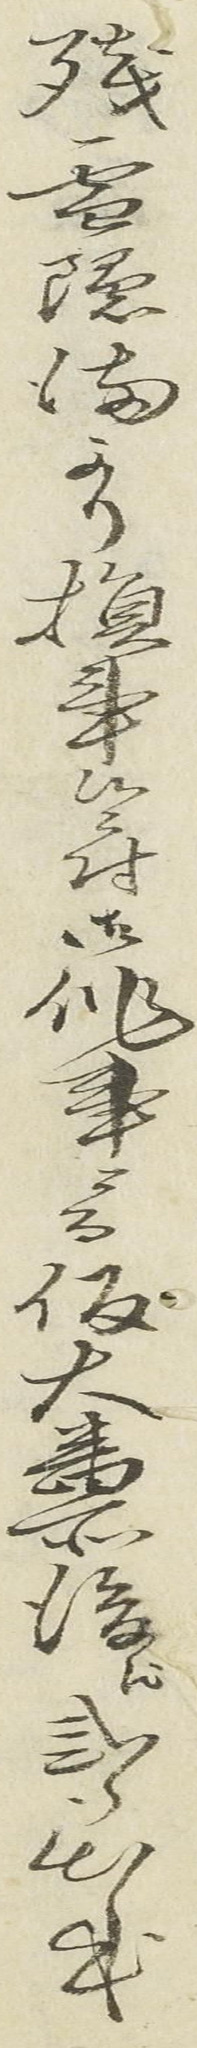残雪隠まかり損事候ニ付御作事ニ而仮大番所後え弐ッ出来
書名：安政二乙卯年十月二日大地震之事
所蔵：東京大学地震研究所図書室 Earthquake Research Institute Library, The University of Tokyo, JAPAN
